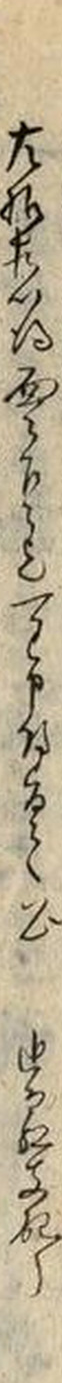左様相心得面々下々迄可被申付旨に候以上追て組支配へ御目付
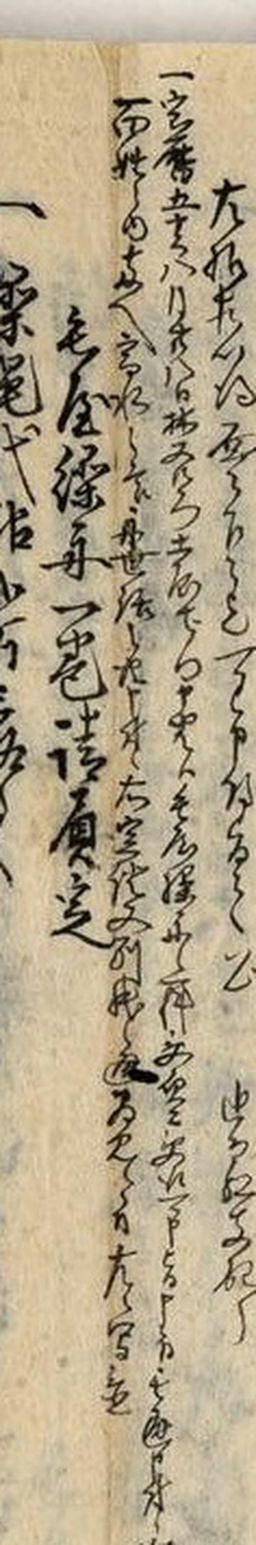百姓之内両人高水之節舟世話之儀申付候右定証文別紙之通為見候に付左に写置
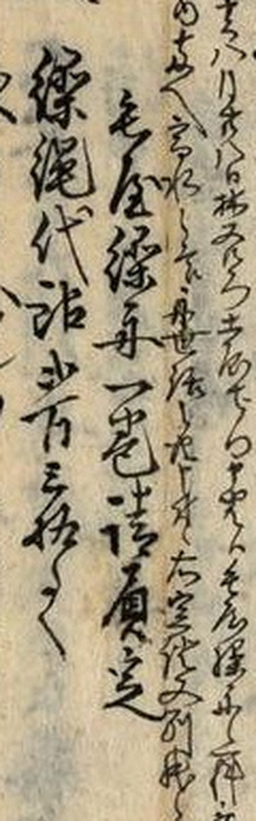毛屋繰舟一巻請負定
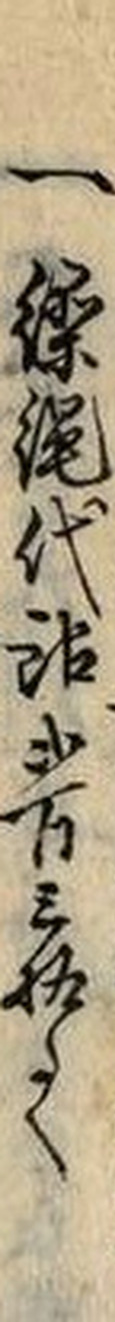一繰縄代銀弐百三拾匁
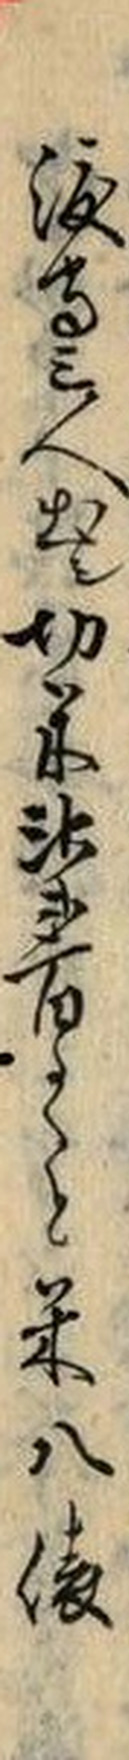渡守三人出シ切米銀弐百匁と米八俵

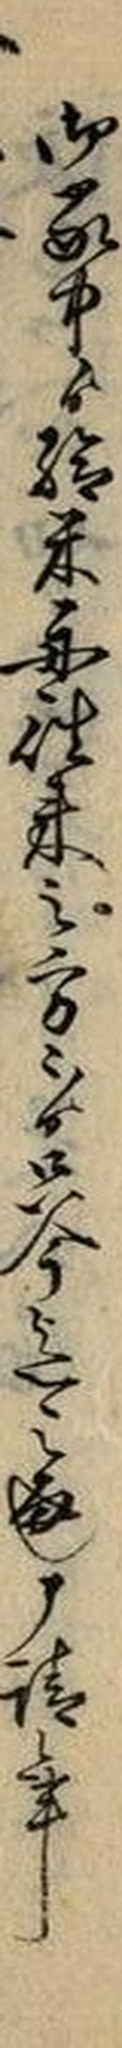御家中ゟ給米舟往来之方々ゟ只今迄之通申請候事
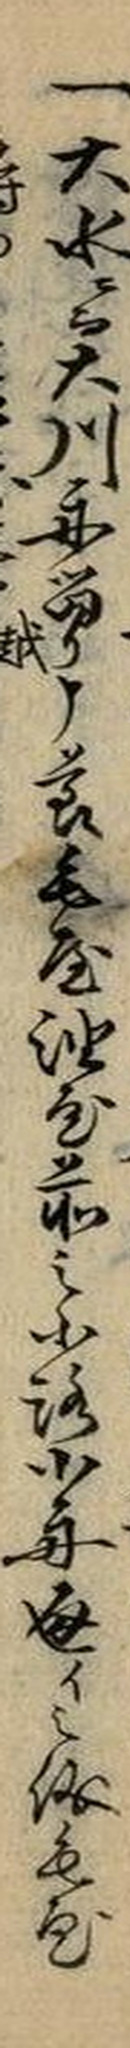一大水にて大川舟留り申節毛屋油屋前之小路小舟通イ之儀毛屋
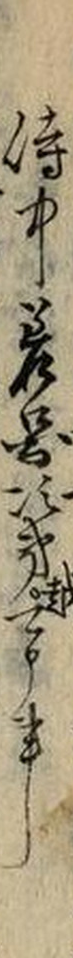侍中差図次第◦越可申事
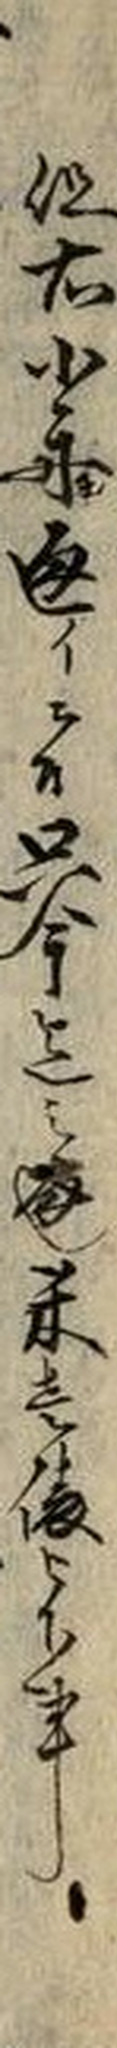但右小舟通イに付只今迄之通米壱俵被下事
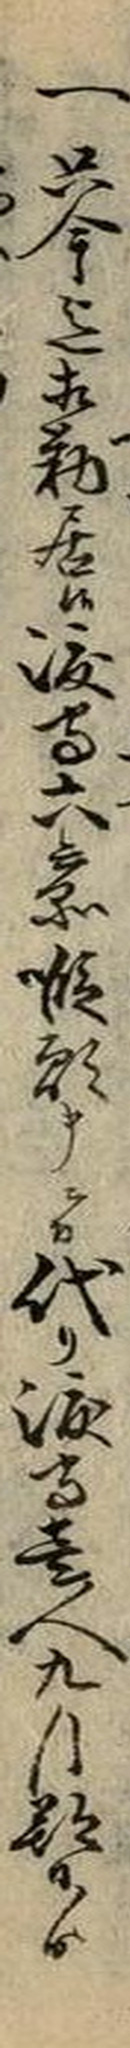一只今迄相勤居候渡守六兵衛暇願申に付代り渡守壱人九月朔日ゟ
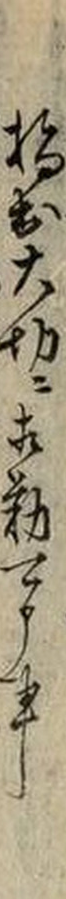指出大切に相勤可申事
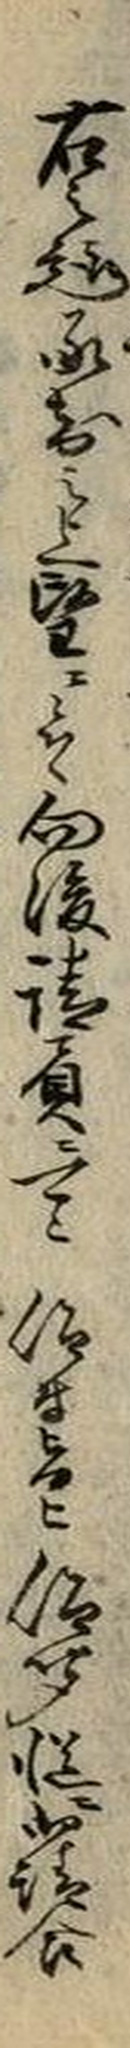右之趣承知之上望に候はゝ向後請負に可被仰付旨被仰聞慥に御請合
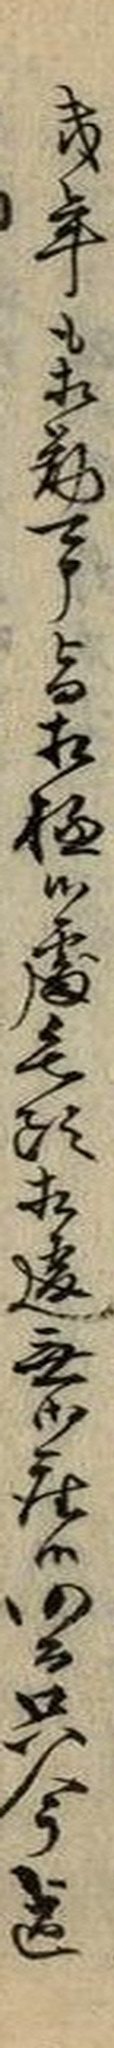幾年も相勤可申旨相極候処毛頭相違無御座候仍て只今迄
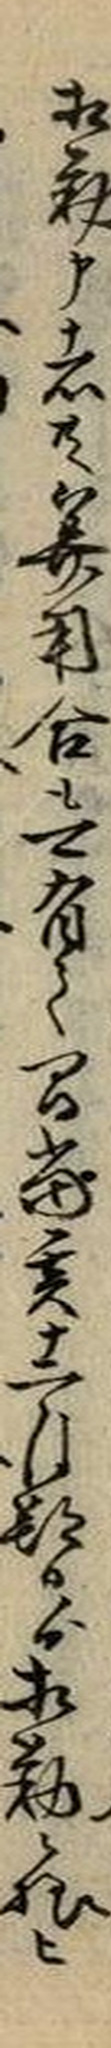相勤申者共算用合も可有之間当亥十二月朔日ゟ相勤候様被
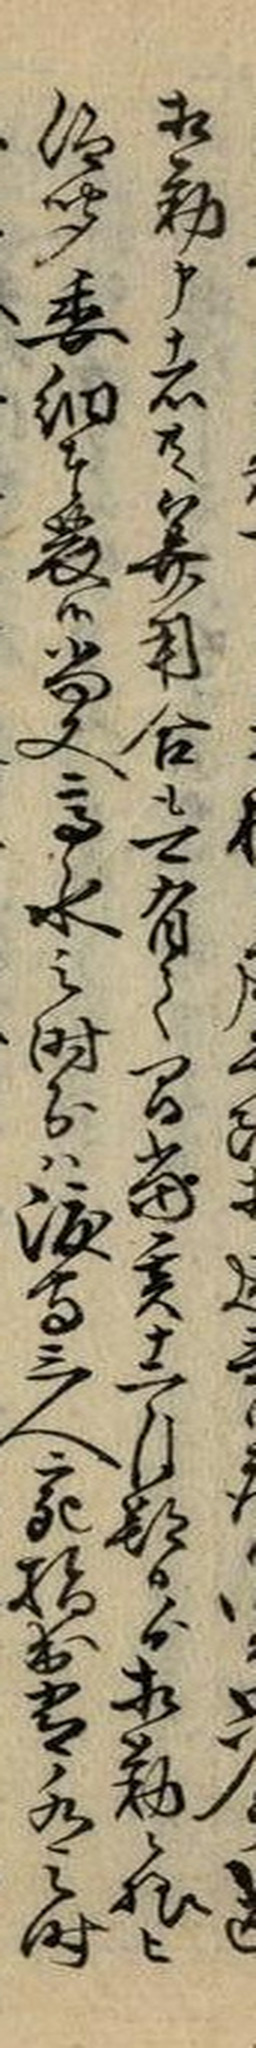仰聞委細奉畏候尚又高水之時分は渡守三人宛指出常水之時
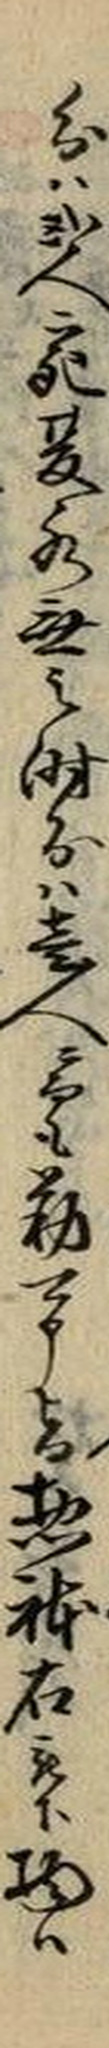分は弐人宛夏水無之時分は壱人にても勤可申旨惣体右被下物は
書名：御城下諸事之部
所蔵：福井県文書館 Fukui Prefectural Archives
